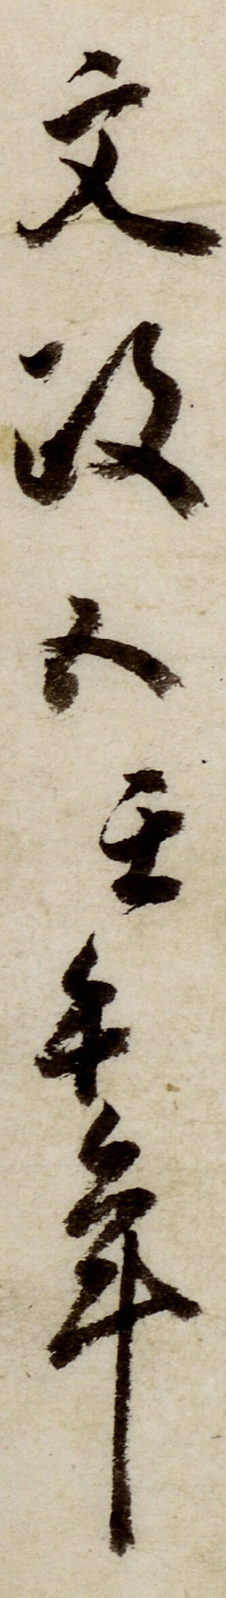文政五壬午年
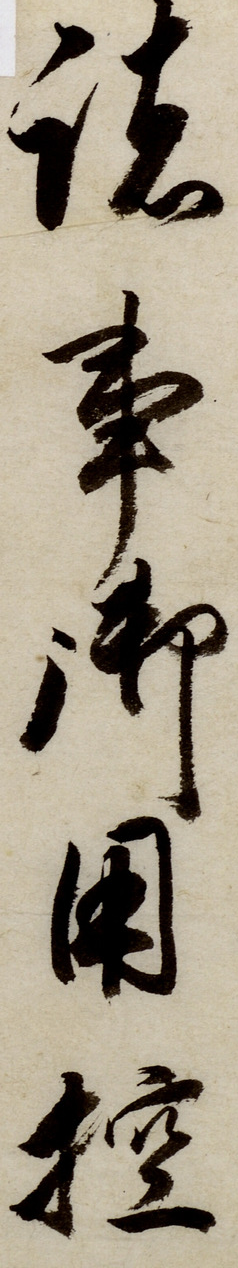諸事御用控
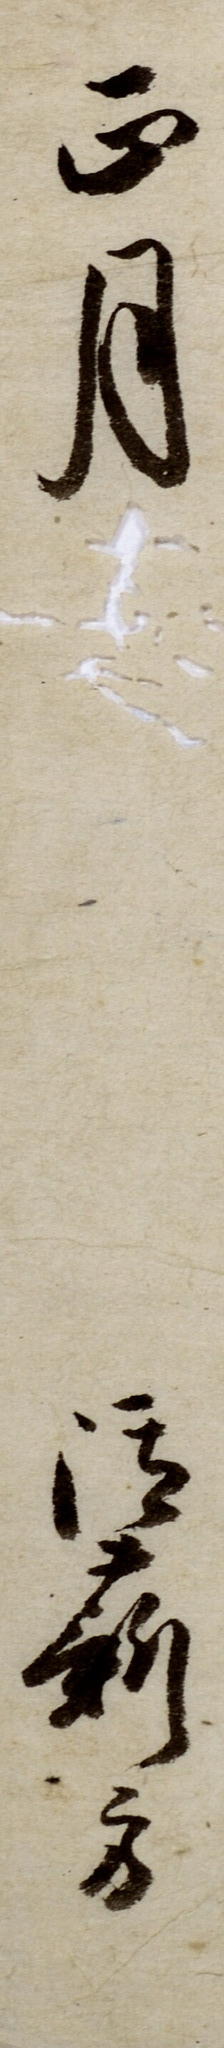正月御薪方
